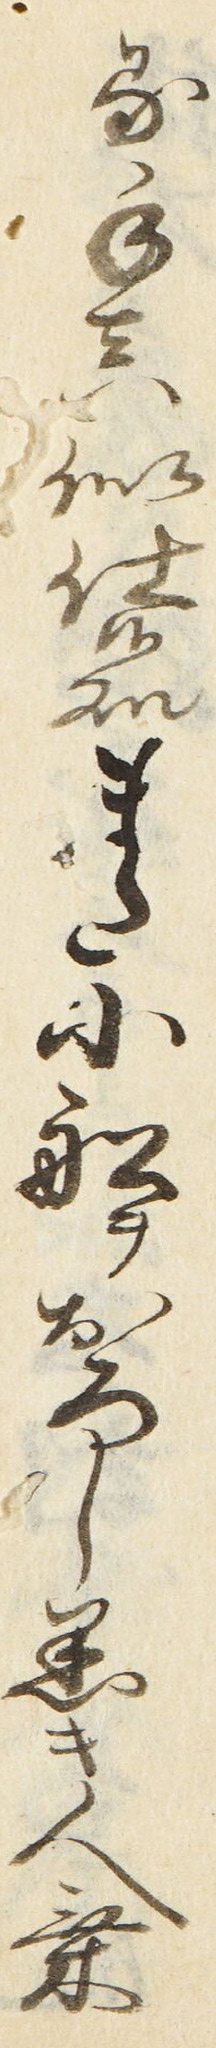る手真似仕候処また小舩ヲおろし黒キ人乗
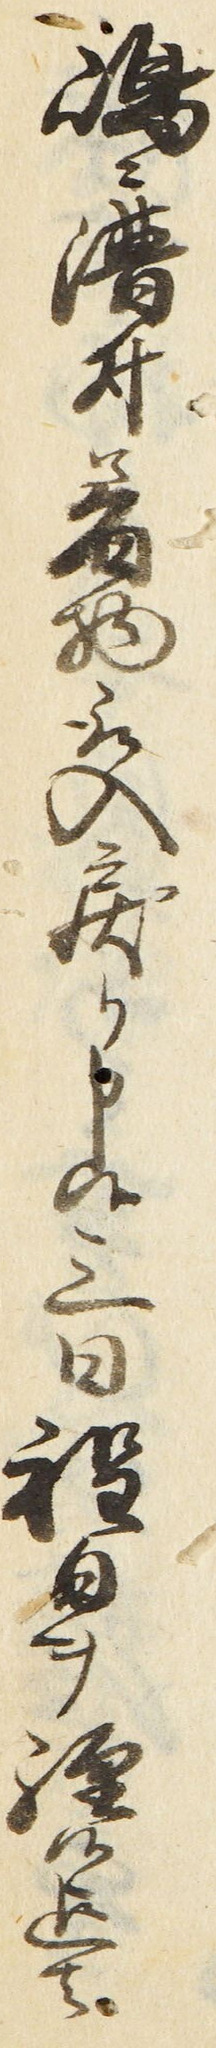嶋ニ漕付着物取入戻り申候三日程日ヲ經候迄者

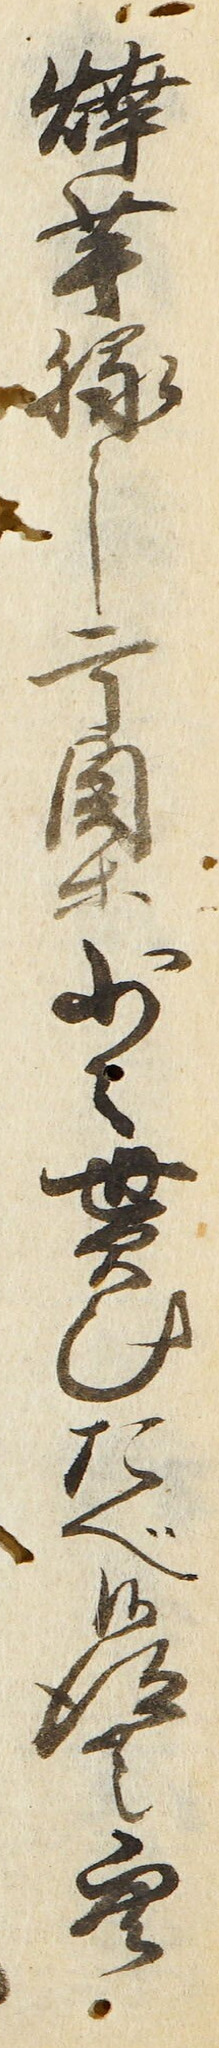焼芋様之干肉等少々貰ひたべ候得者空
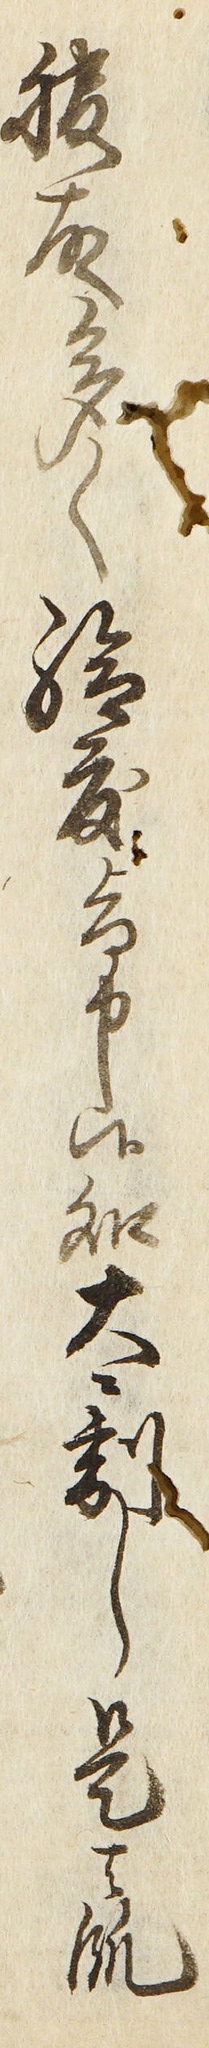腹故多く給度旨申候処大ニ制し是者飢
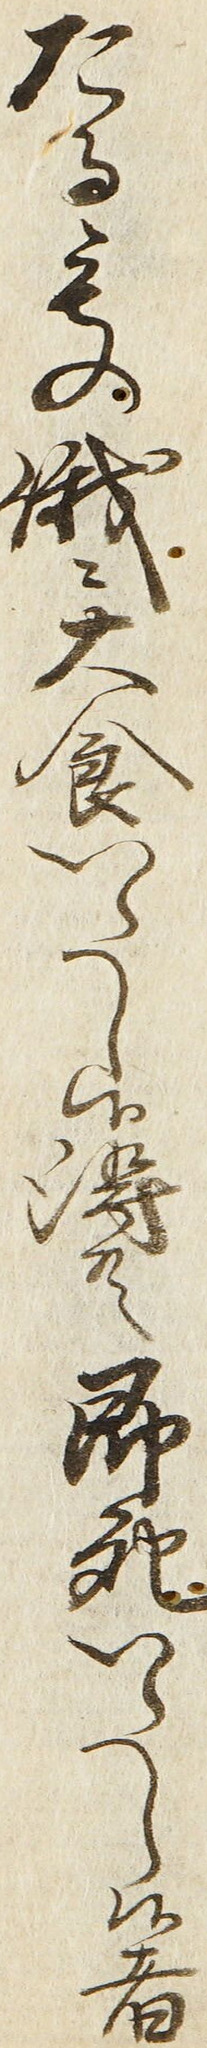たるもの俄ニ大食いたし候得者即死いたし候者
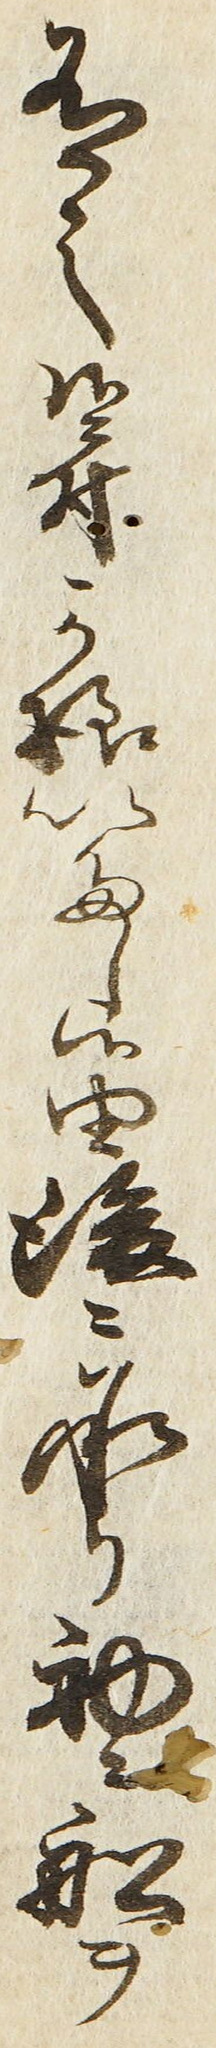有之候ニ付か様いたし候由後ニ承り初ニ舩ヲ
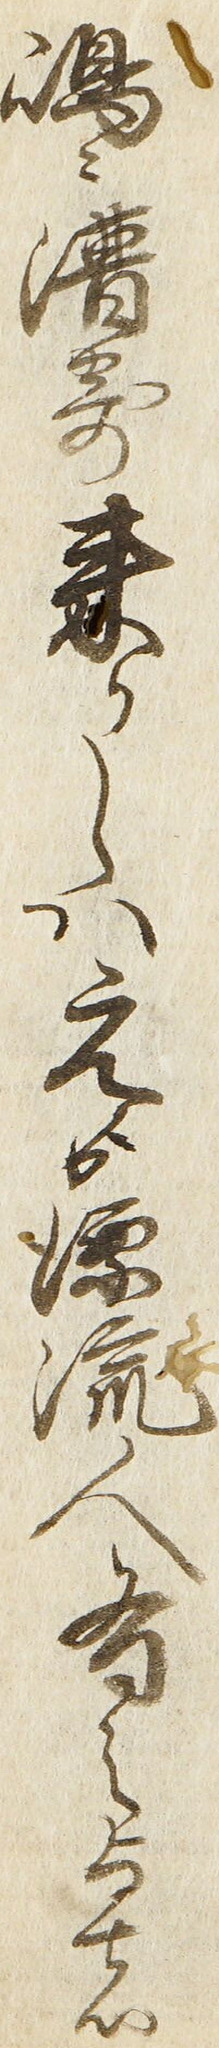嶋ニ漕寄来りしハ元ゟ漂流人有之と者
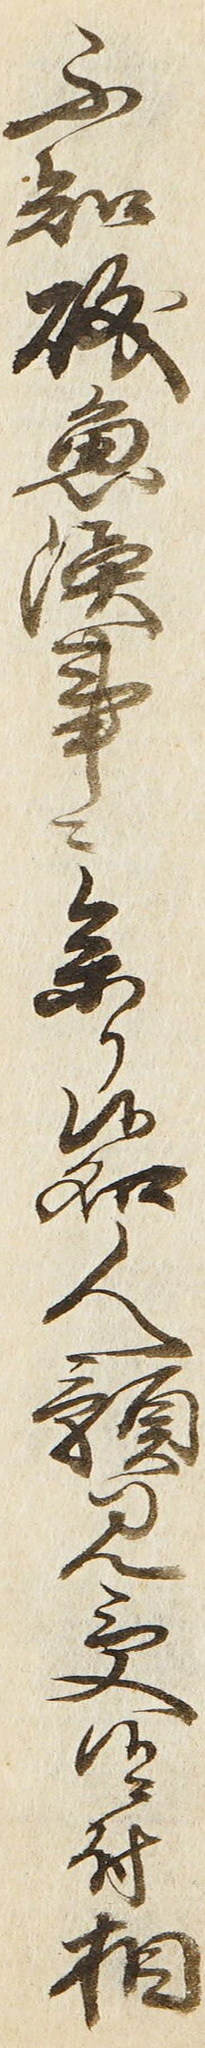不知磯魚漁事ニ参り候処人頭見受候ニ付相
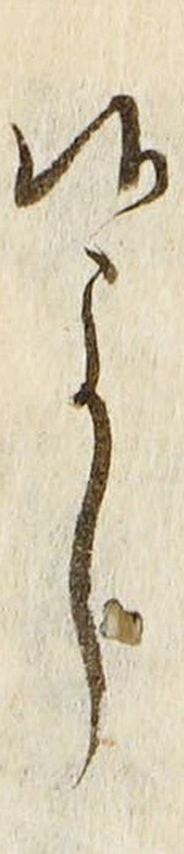候よし
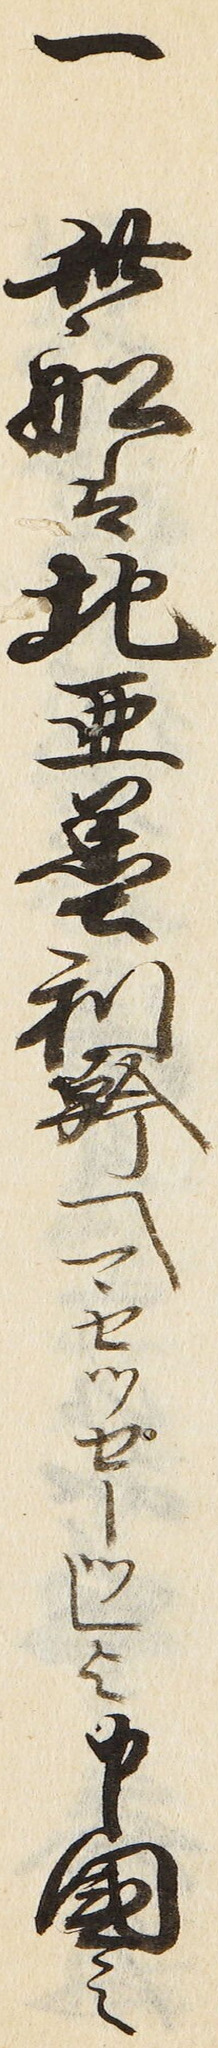一此舩は北亜墨利幹「マセツセーツ」と申國之
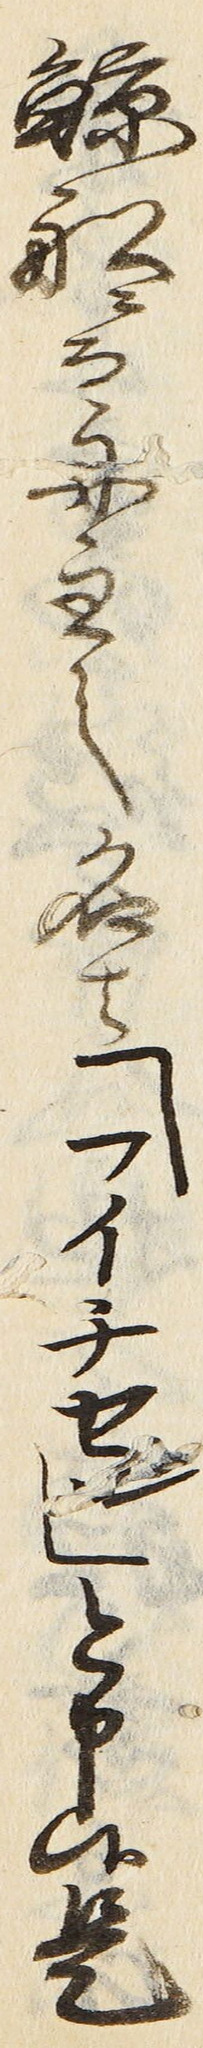鯨舩ニ而舟主之名者「フイチセン」と申候是
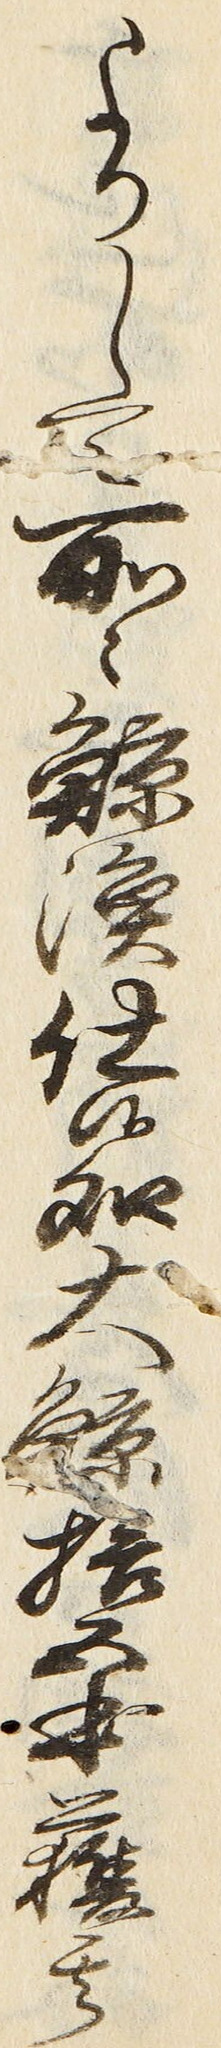よりして所々鯨漁仕候処大鯨拾五本獲其
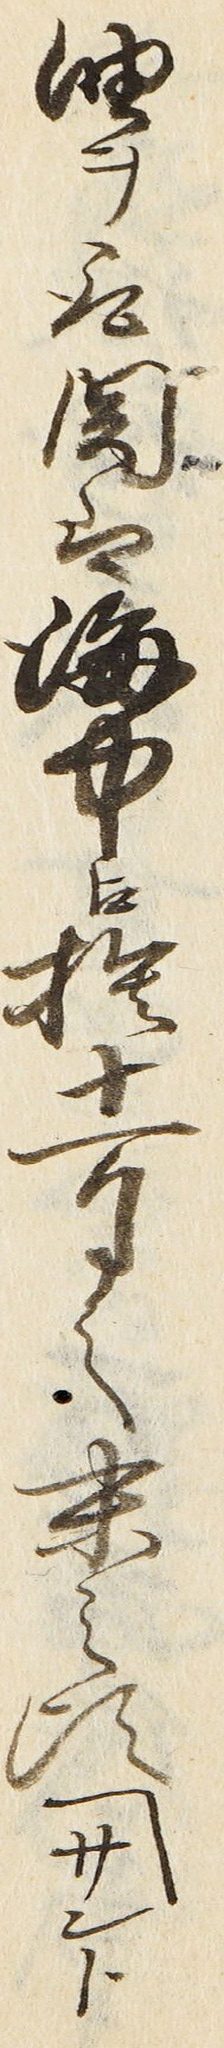油ヲ取肉は海中江捨十一月之末之頃「サント
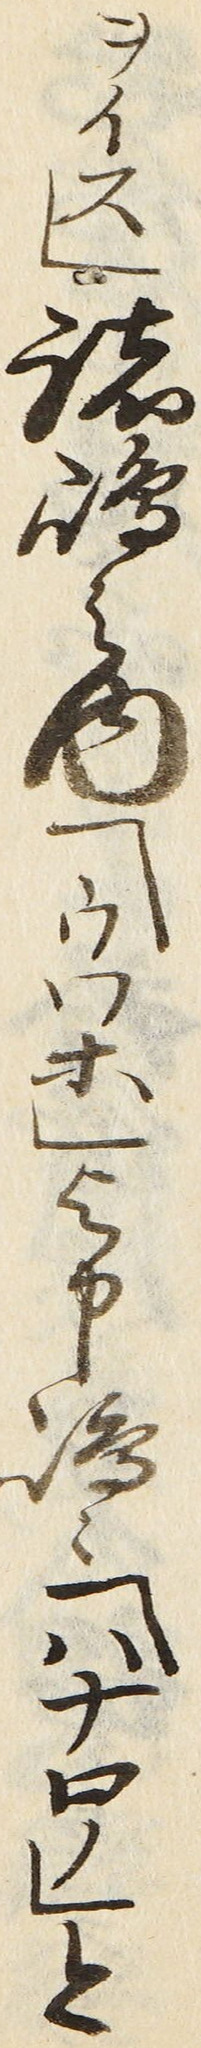ヲイス」諸島之内「ウワホ」と申嶋々「ハナロノ」と
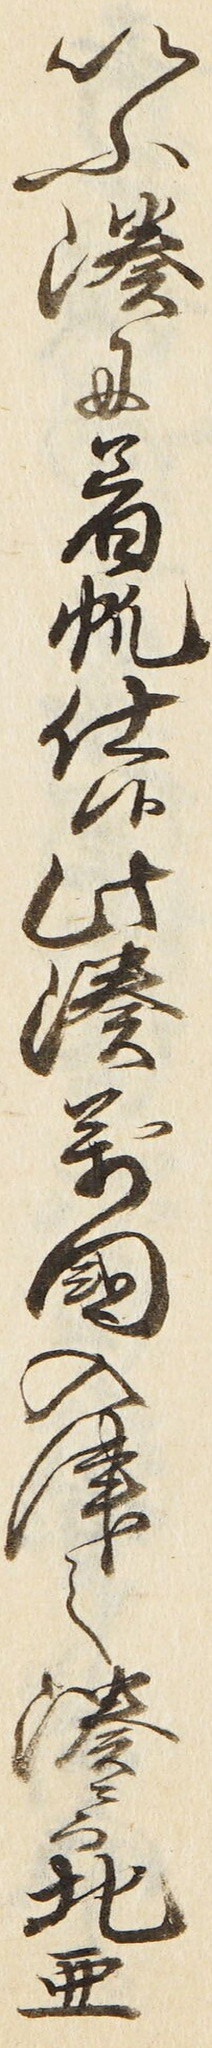いふ湊に着帆仕候此湊萬國入津之湊ニ而北亜
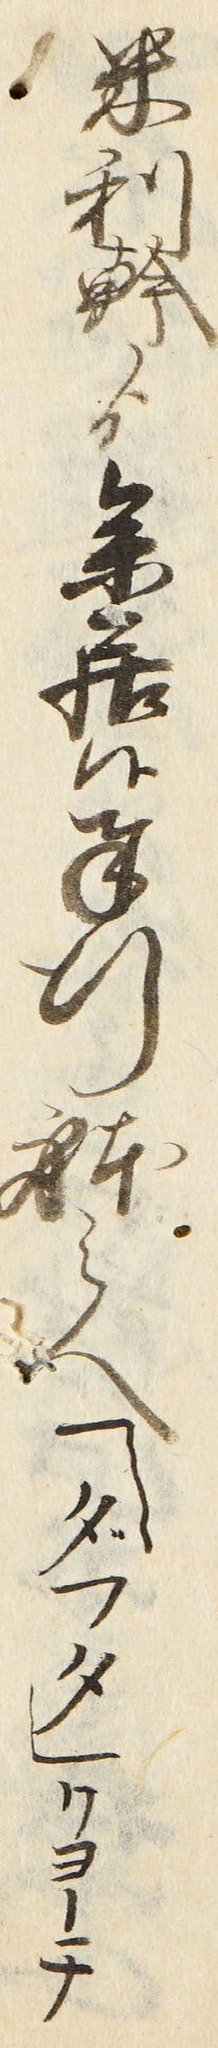米利幹ゟ参居候奉行躰之人「ダフタ」クヨーチ
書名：漂客談寄
